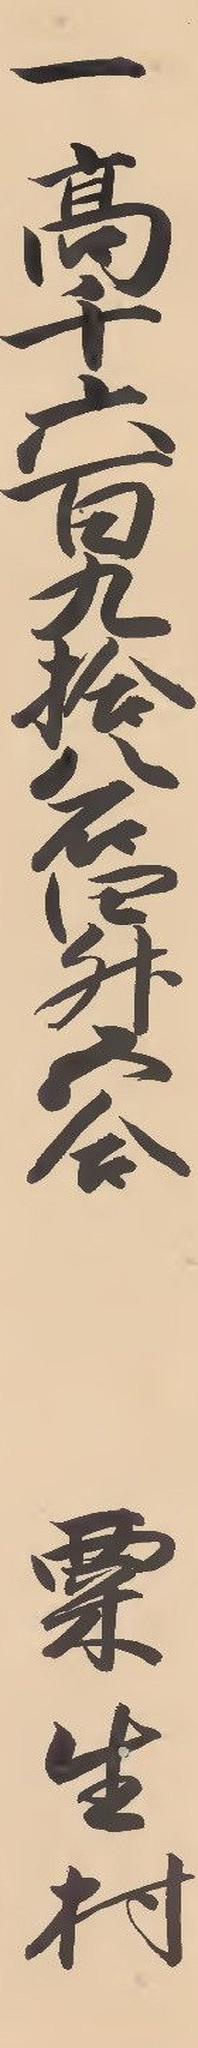一高千六百九拾八石四升五合粟生村
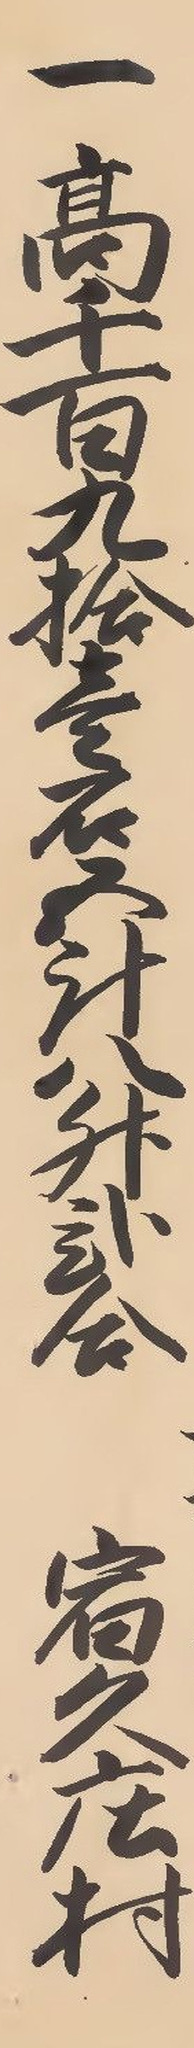一高千百九拾壱石五斗八升弐合宿久庄村
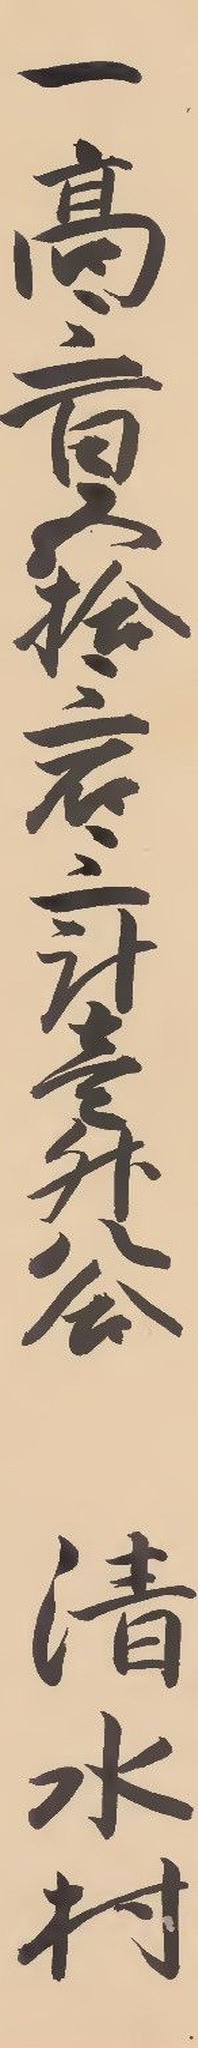一高三百五拾三石三斗壱升八合清水村
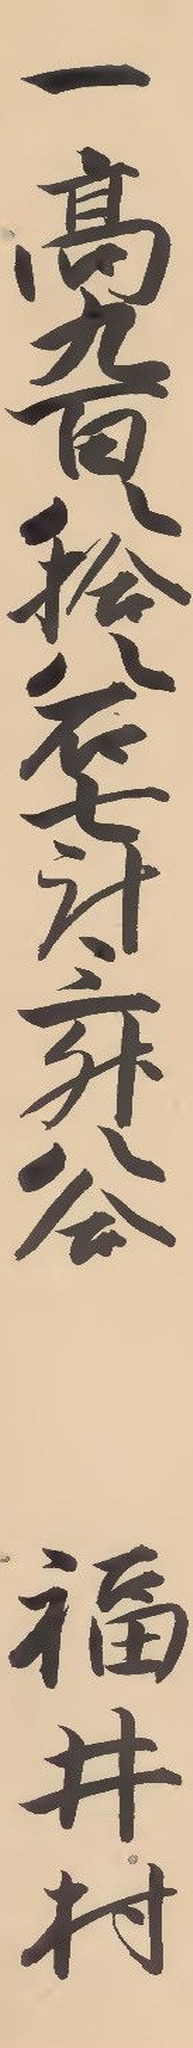一高九百八拾八石七斗三升八合福井村

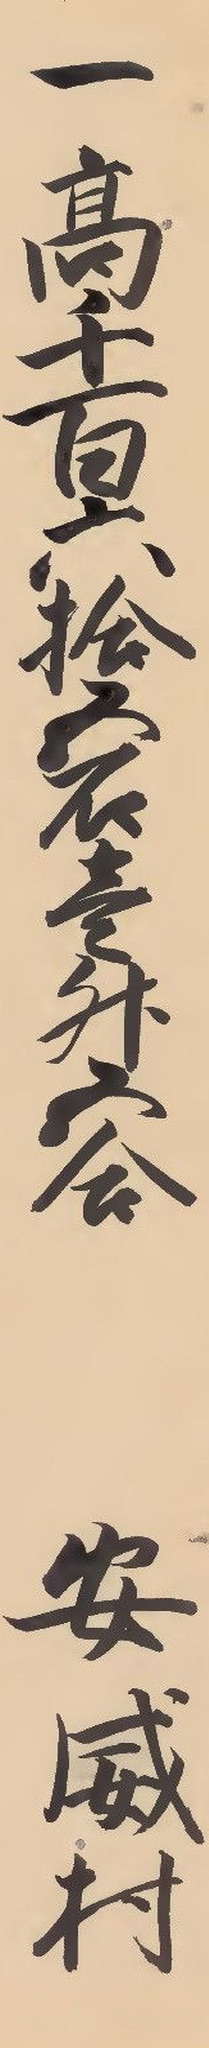一高千百六拾五石壱升五合安威村
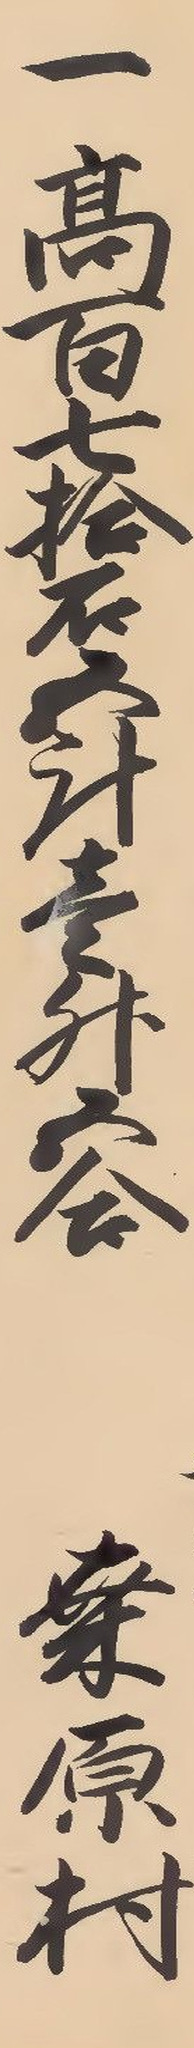一高百七拾石五斗壱升五合桑原村
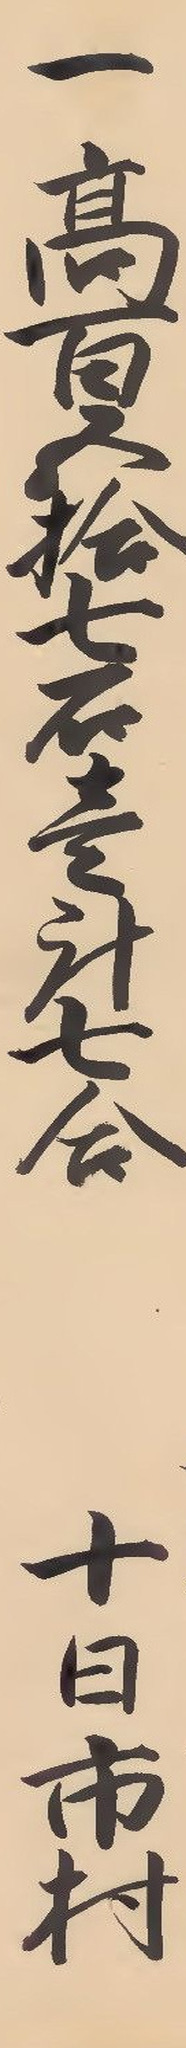一高百五拾七石壱斗七合十日市村
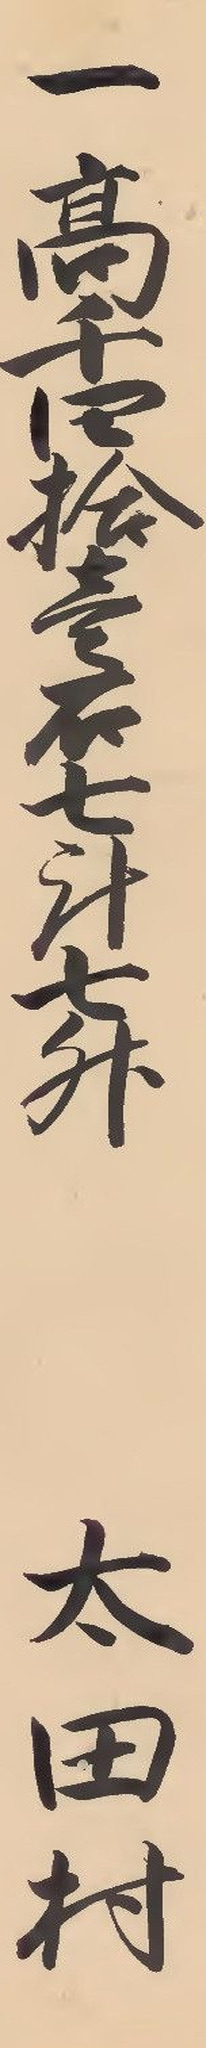一高千四拾壱石七斗七升太田村
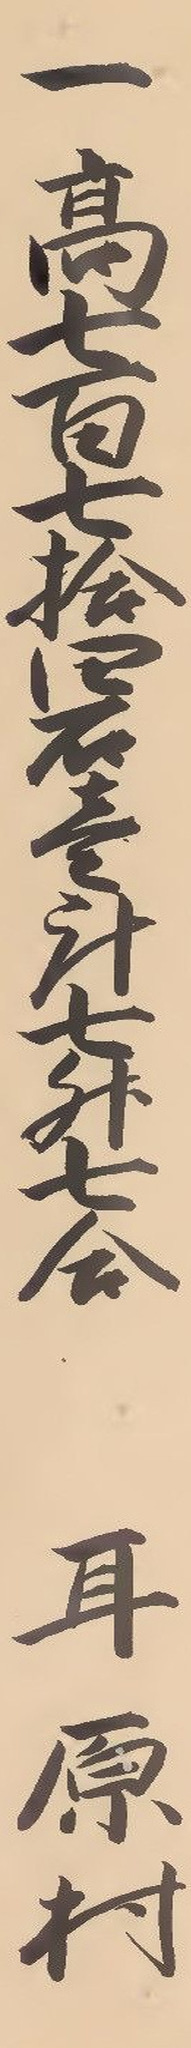一高七百七拾四石壱斗七升七合耳原村
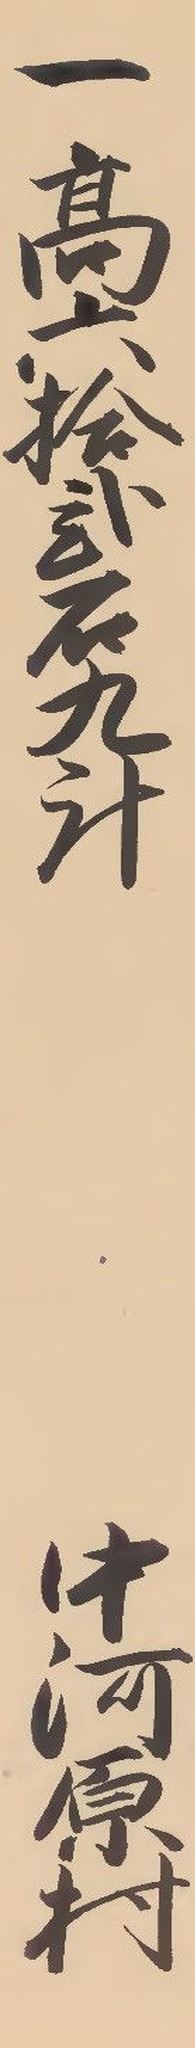一高六拾弐石九斗中河原村
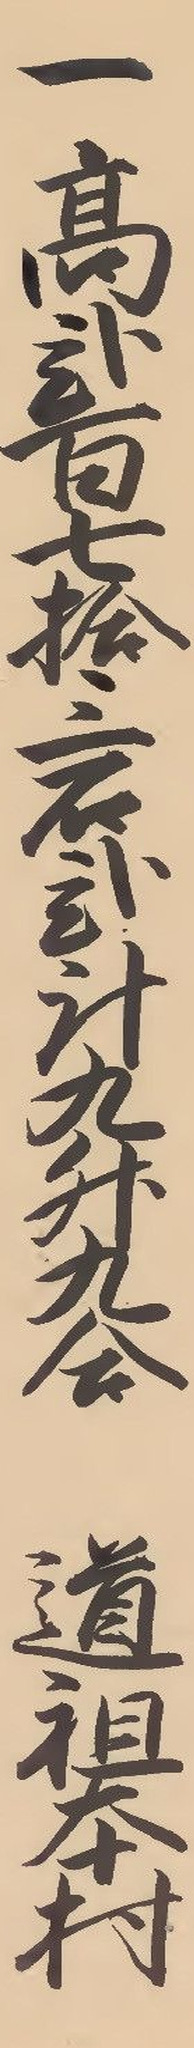一高弐百七拾三石弐斗九升九合道祖本村
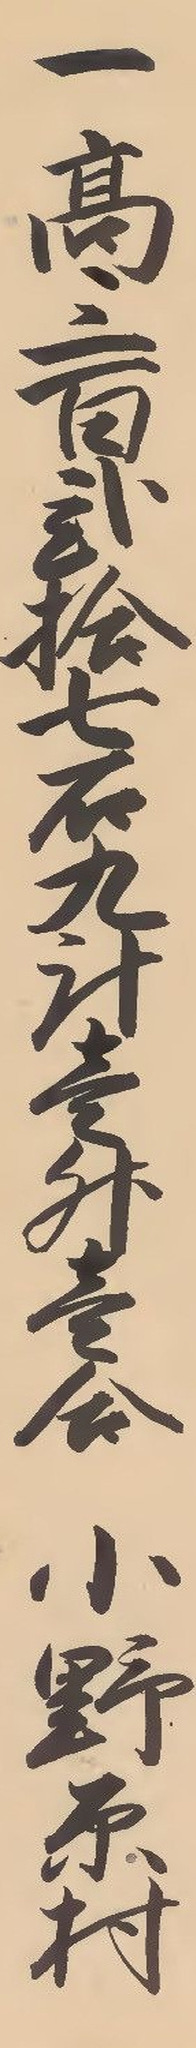一高三百弐拾七石九斗壱升壱合小野原村

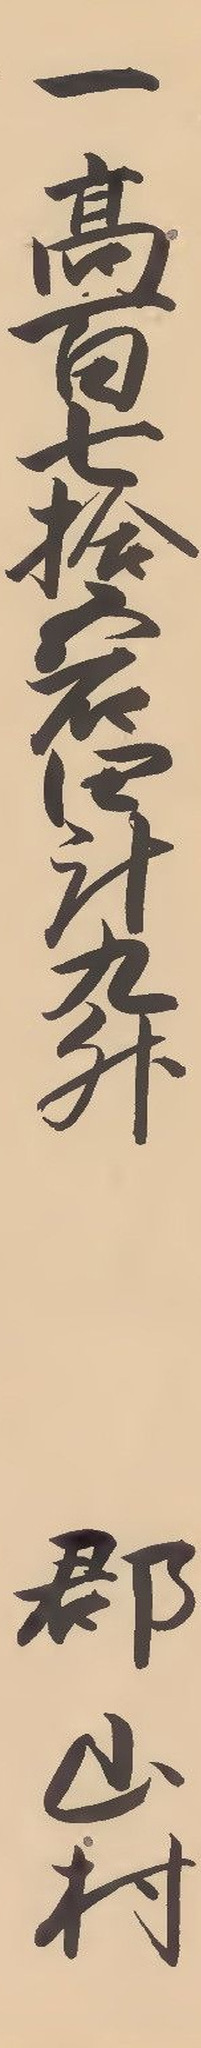一高百七拾五石四斗九升郡山村
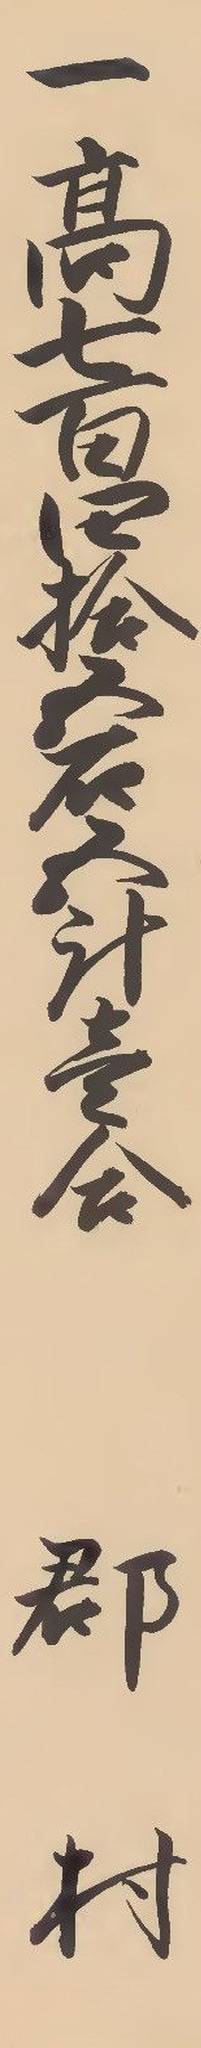一高七百四拾五石五斗壱合郡村
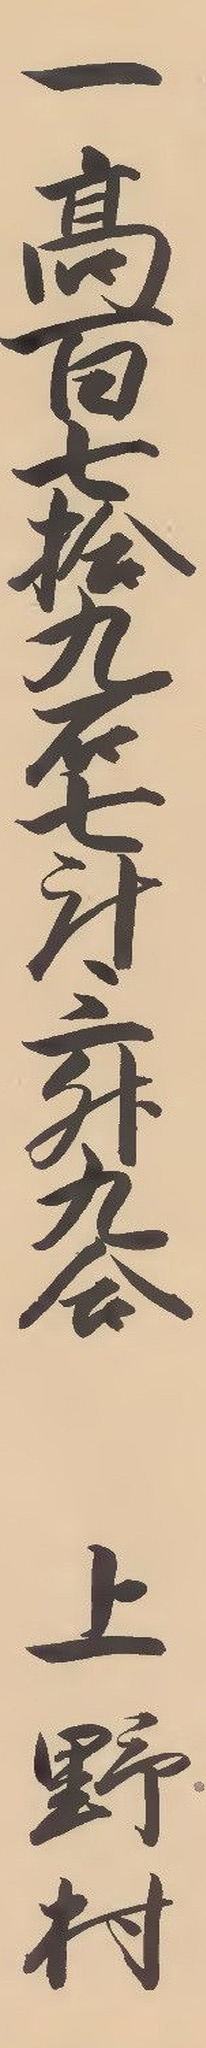一高百七拾九石七斗三升九合上野村
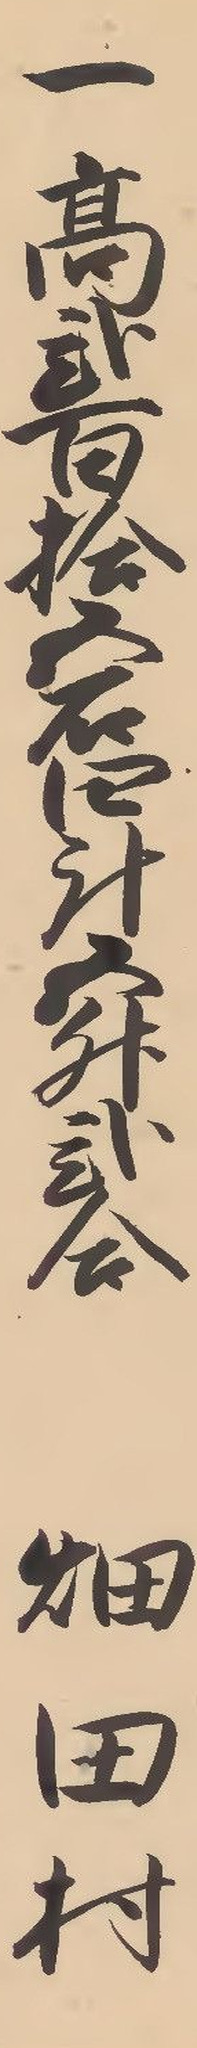一高弐百拾五石四斗五升弐合畑田村
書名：摂津国郷帳
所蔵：国立公文書館 National Archives of Japan
